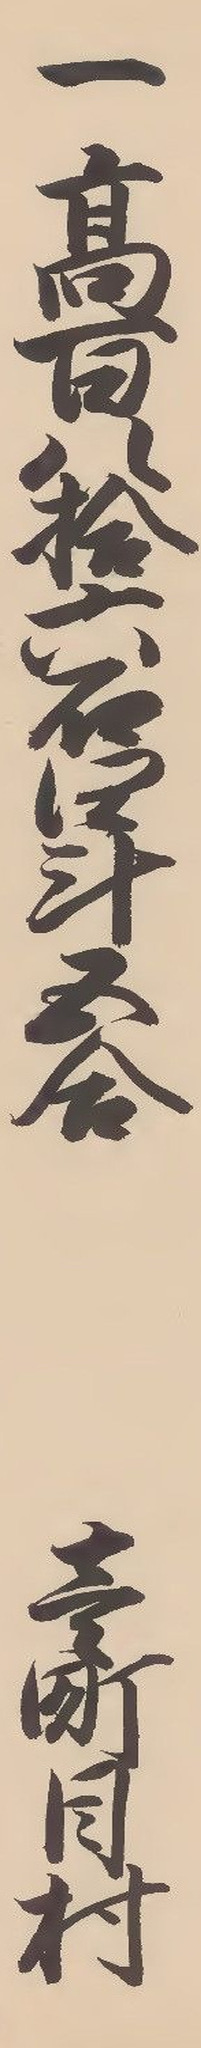一高百八拾六石四斗五合壱町目村
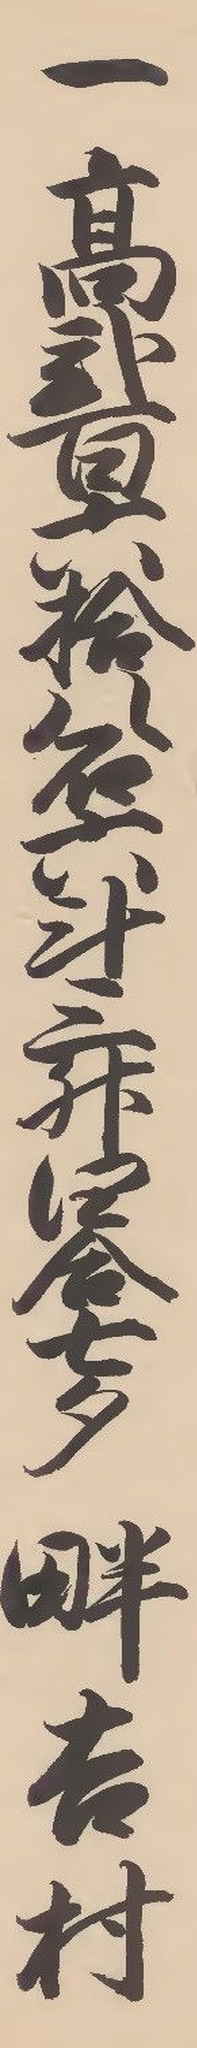一高弐百六拾八石六斗三升四合七勺畔吉村
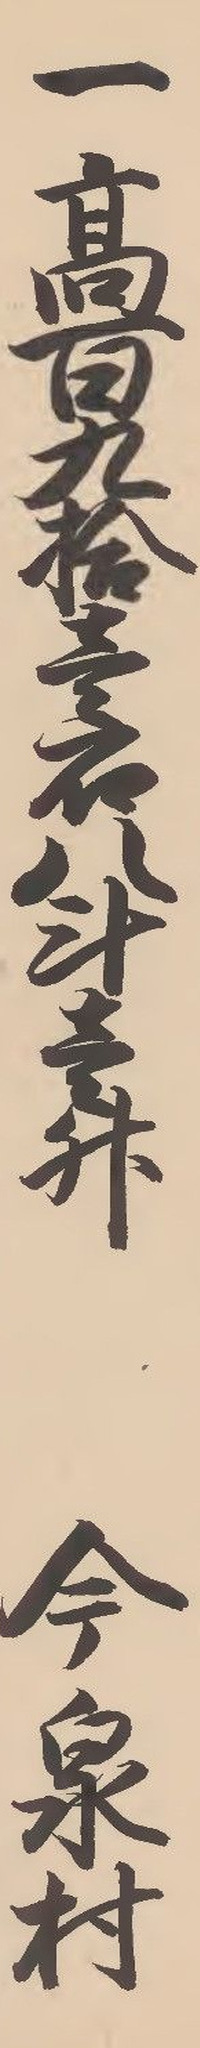一高百九拾壱石八斗壱升今泉村
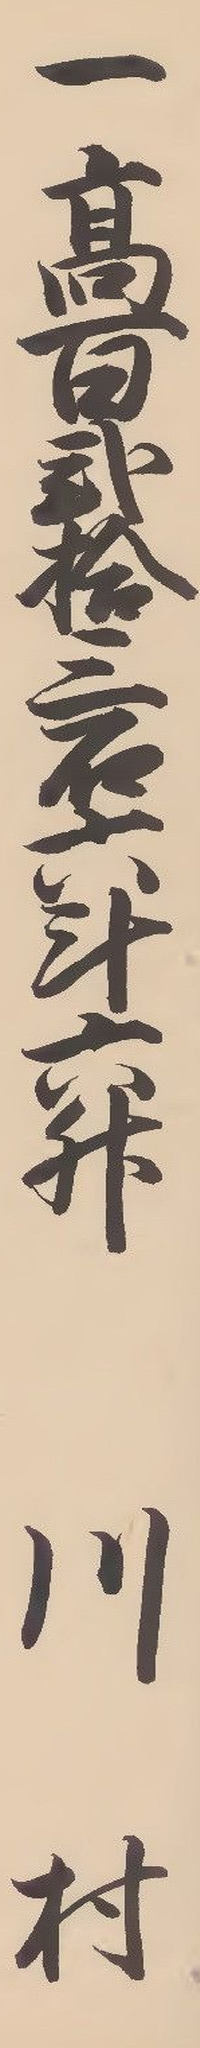一高百弐拾三石六斗六升川村
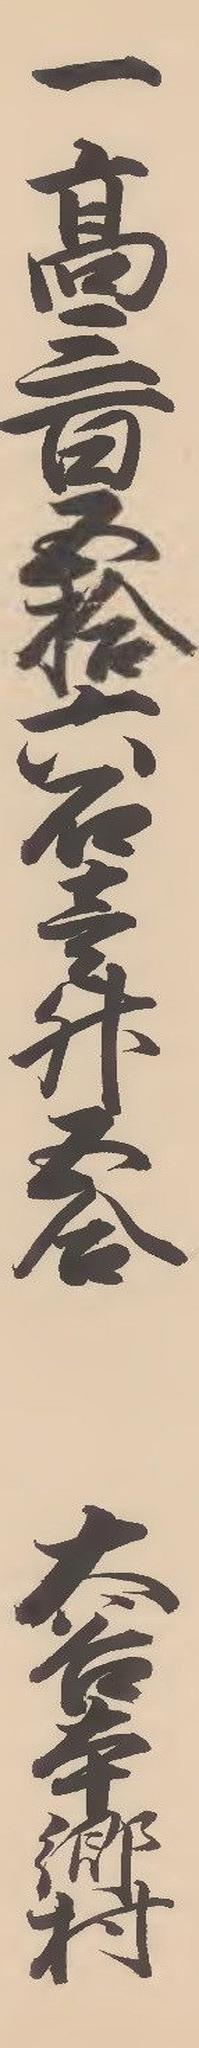一高三百五拾六石壱升五合大谷本郷村
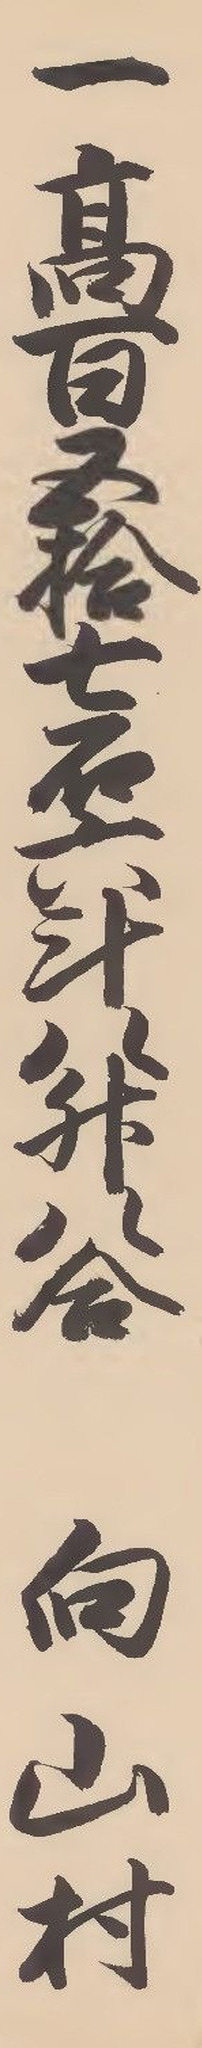一高百五拾七石六斗八升八合向山村
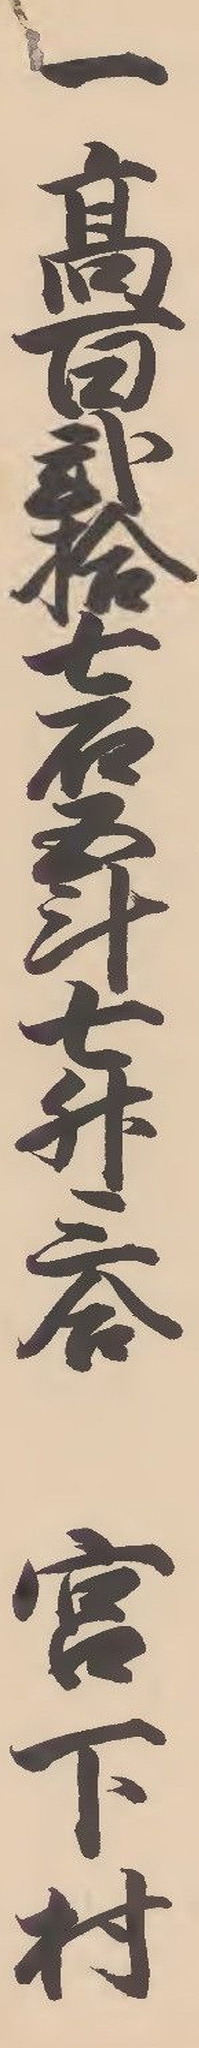一高百弐拾七石五斗七升三合宮下村

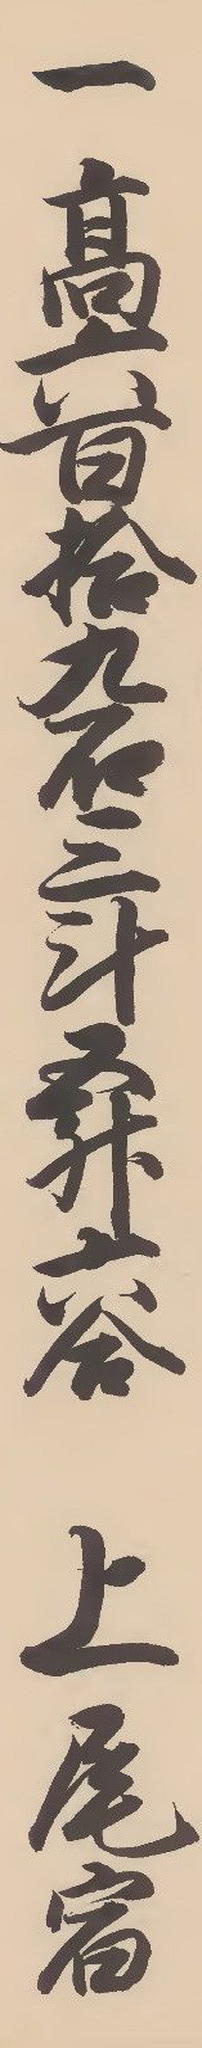一高六百拾九石三斗五升六合上尾宿
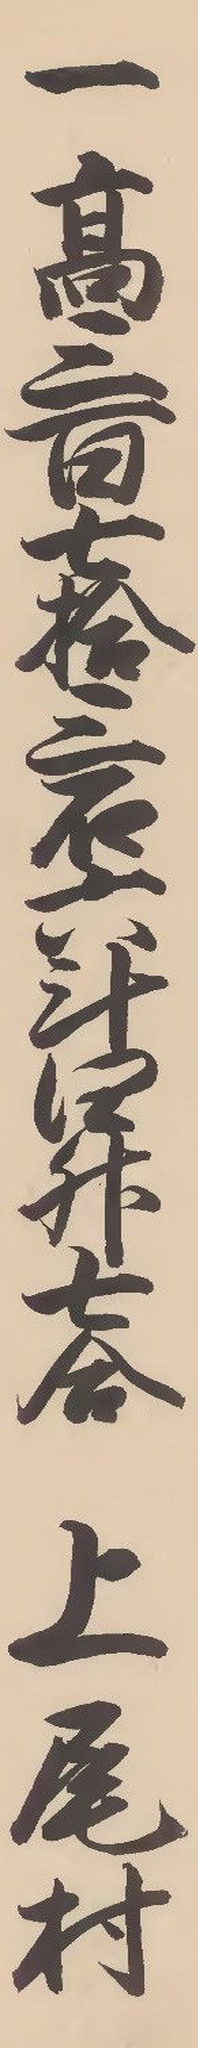一高三百七拾三石六斗四升七合上尾村
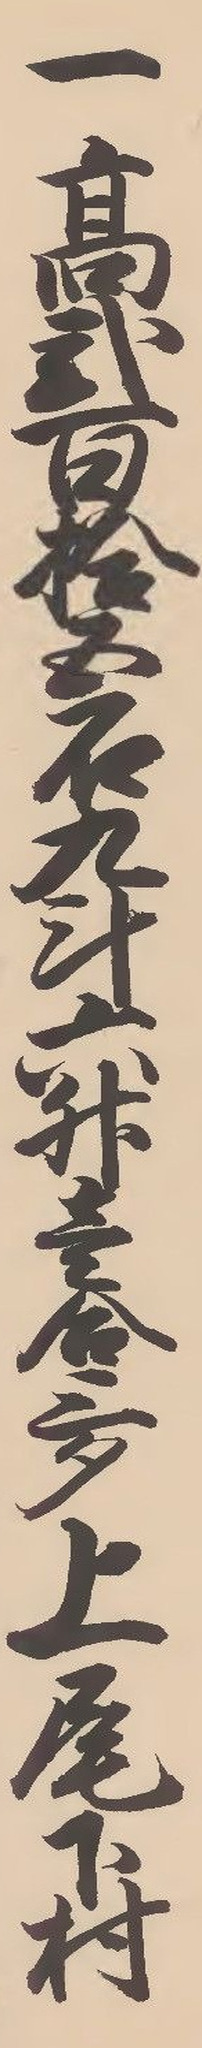一高弐百拾五石九斗六升壱合三勺上尾下村
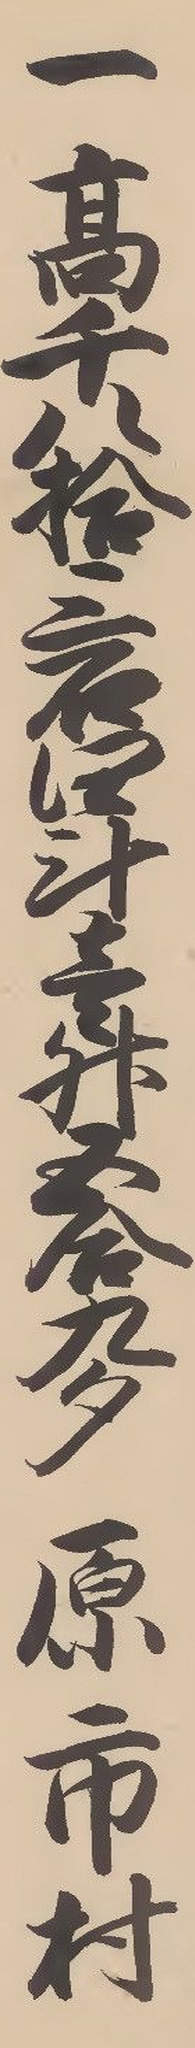一高千八拾三石四斗壱升五合九勺原市村
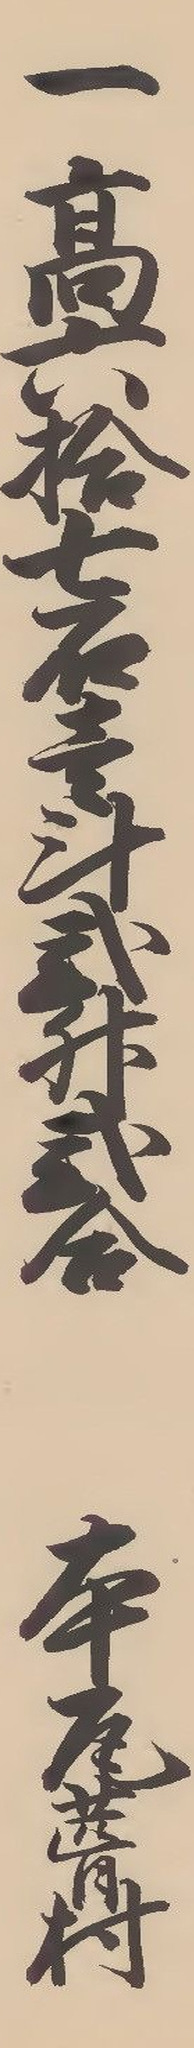一高六拾七石壱斗弐升弐合本瓦葺村
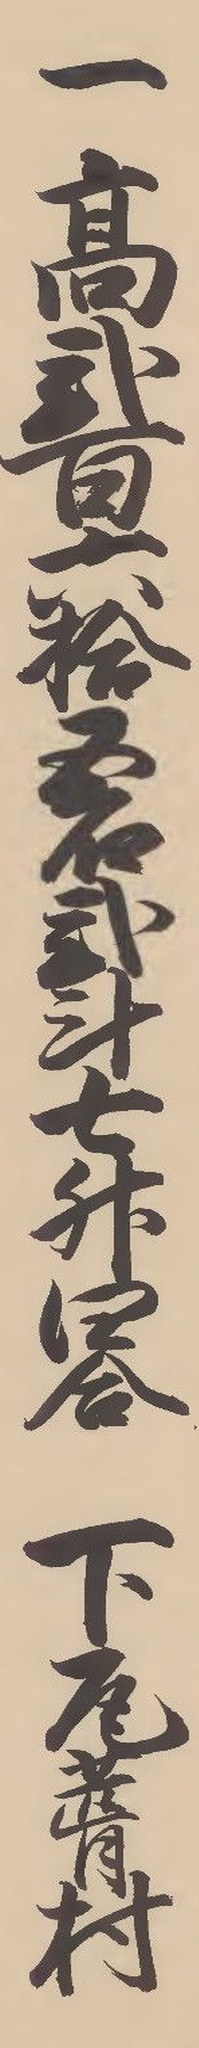一高弐百六拾五石弐斗七升四合下瓦葺村
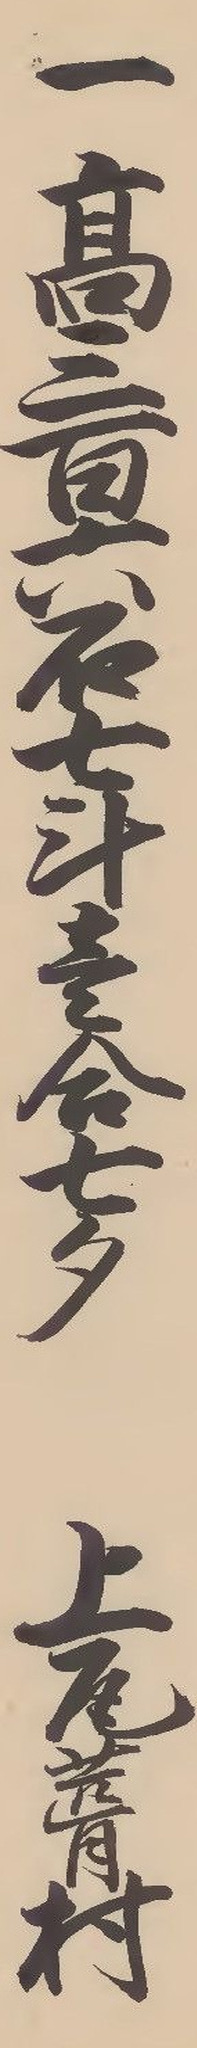一高三百六石七斗壱合七勺上瓦葺村

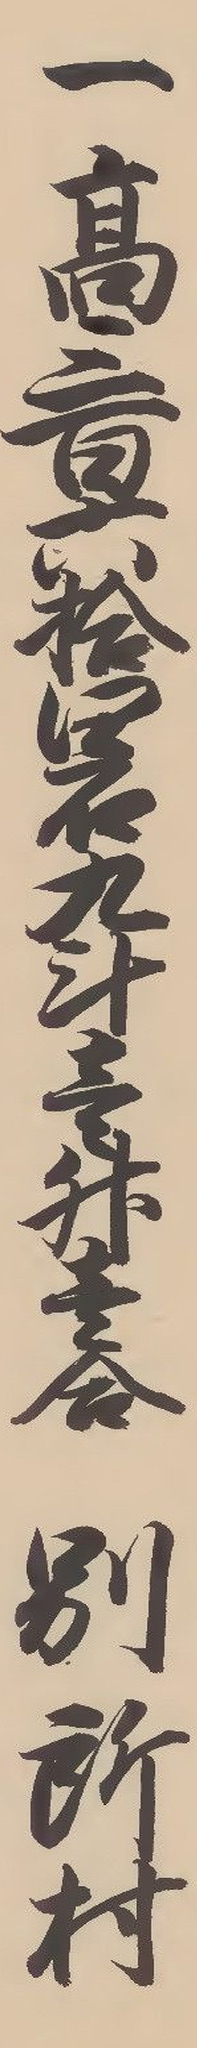一高三百六拾四石九斗壱升壱合別所村
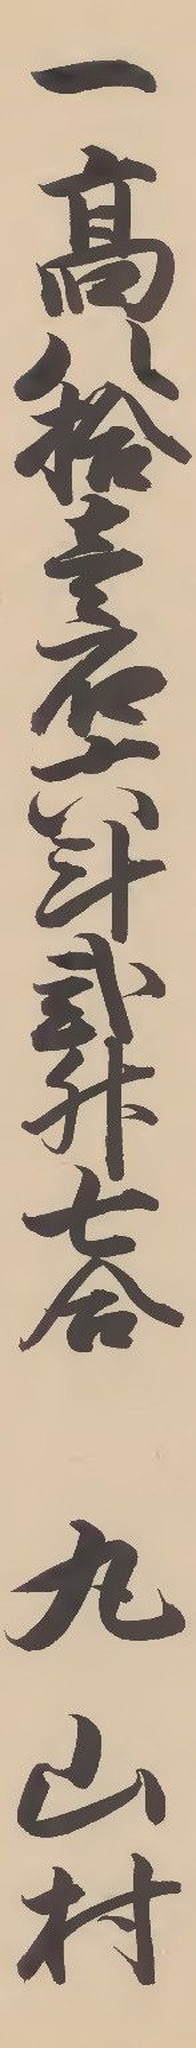一高八拾壱石六斗弐升七合九山村
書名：武蔵国郷帳　下
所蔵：国立公文書館 National Archives of Japan
